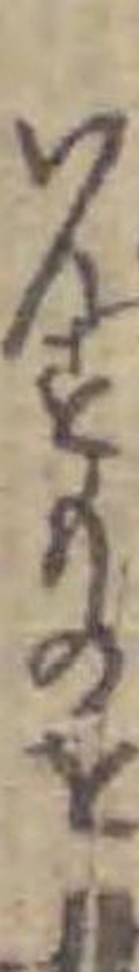いんすものを
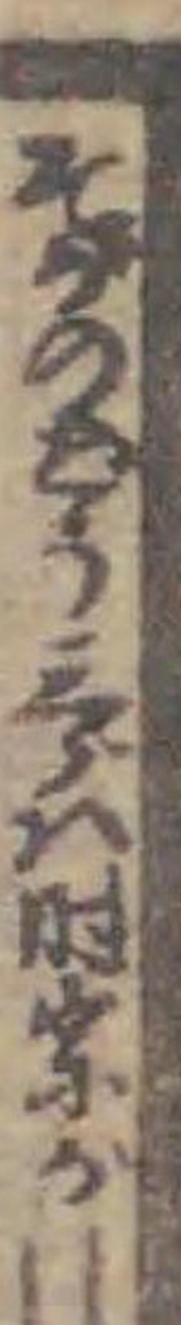そがのどう三郎は時宗が
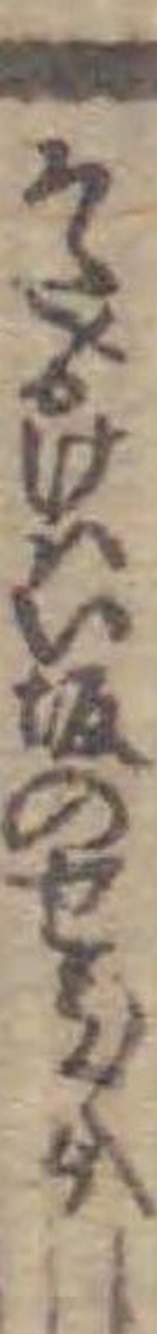かたゟるけはい坂のせう〳〵ら
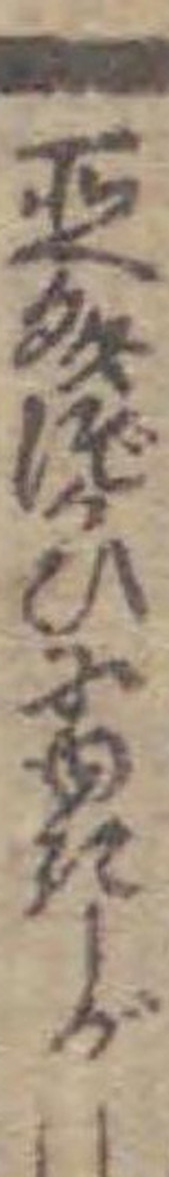所へ文づかひにゆきしが
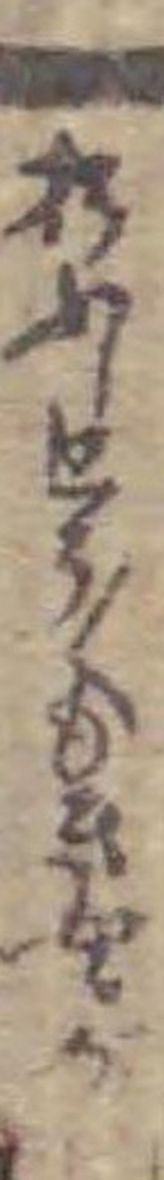折ふしせう〳〵もきやくが
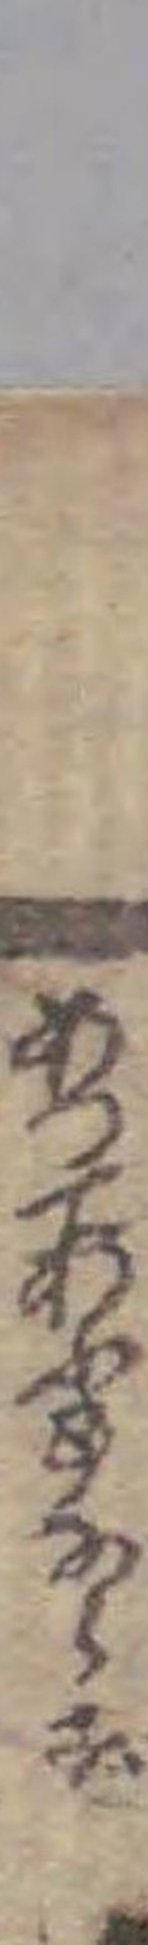あつてあふ事ならず
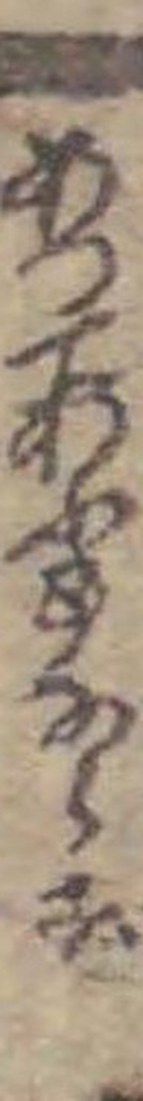あつてあふ事ならず
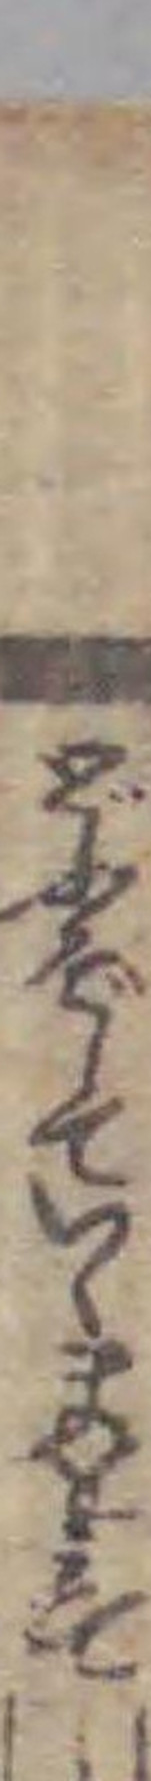どふぞしていゝまをみて
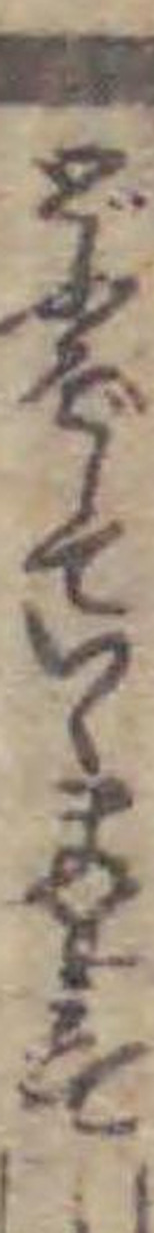どふぞしていゝまをみて
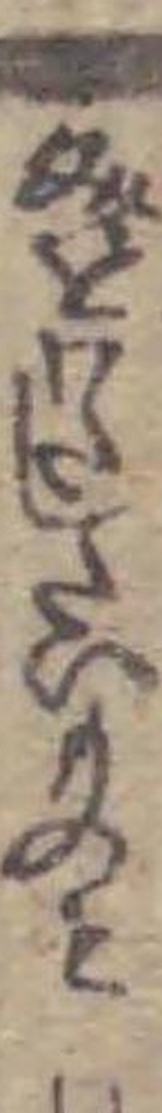文をわたしたいものと
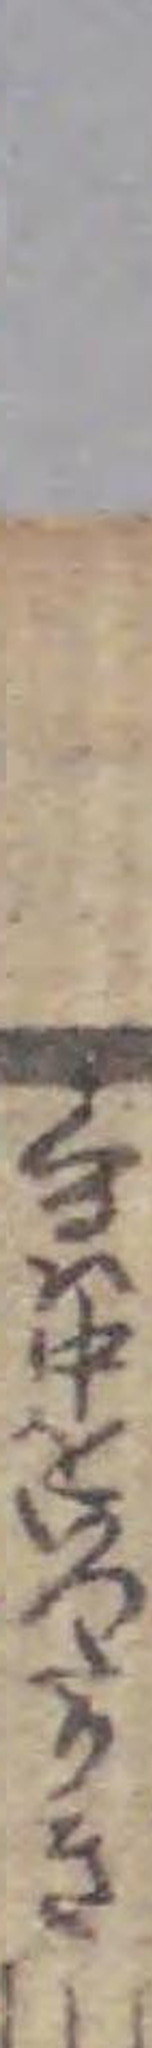くるは中をいつたりき
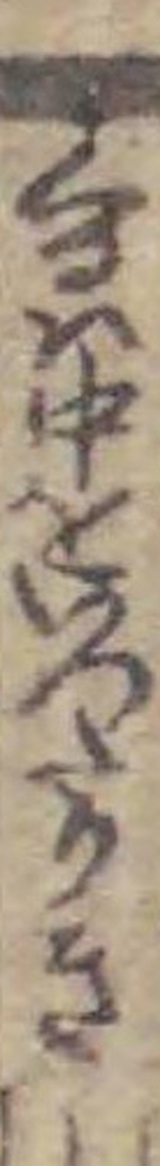くるは中をいつたりき
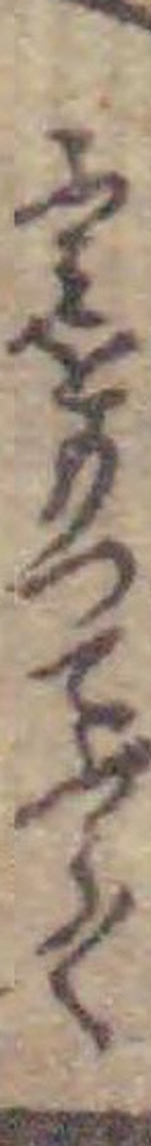ふみをもつてぶら〳〵
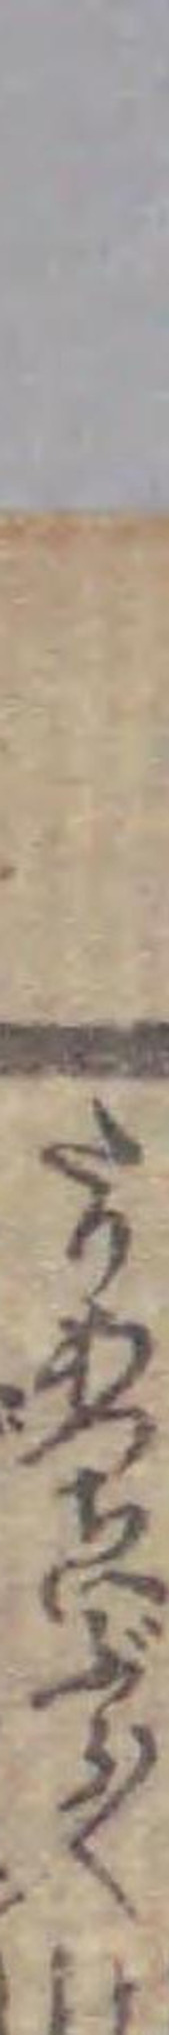たりあつちへぶら〳〵
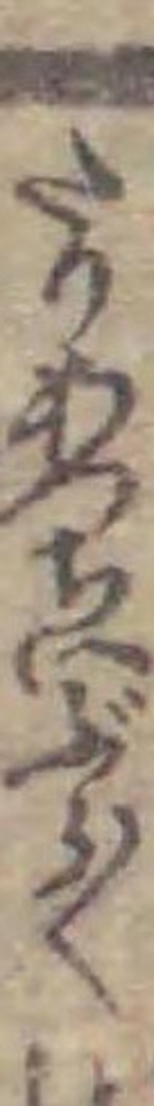たりあつちへぶら〳〵
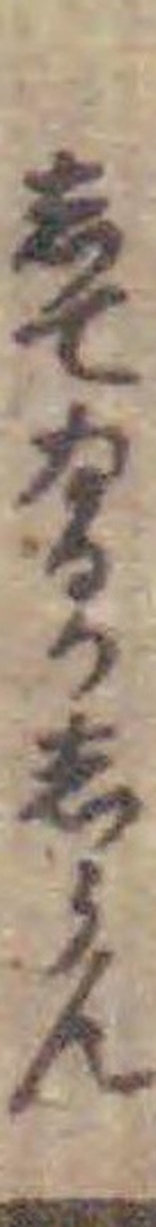してゐるかしらん
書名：年寄之冷水曽我 : 3巻
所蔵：国立国会図書館 National Diet Library, JAPAN
